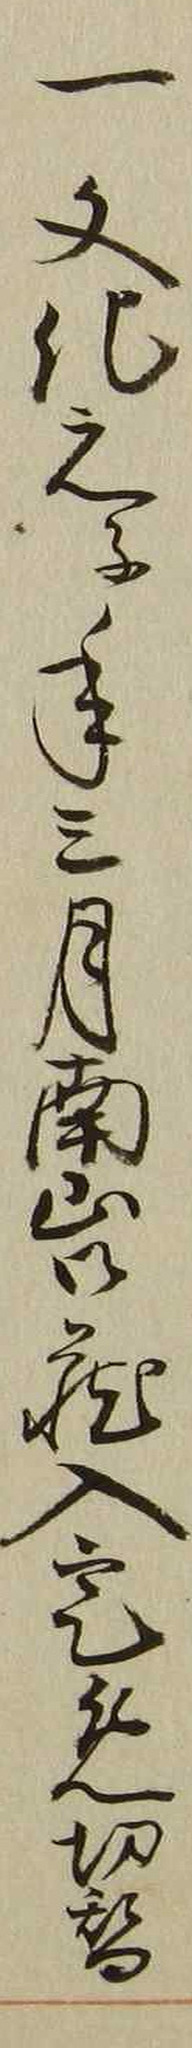一文化元子年三月南山御蔵入定免切替
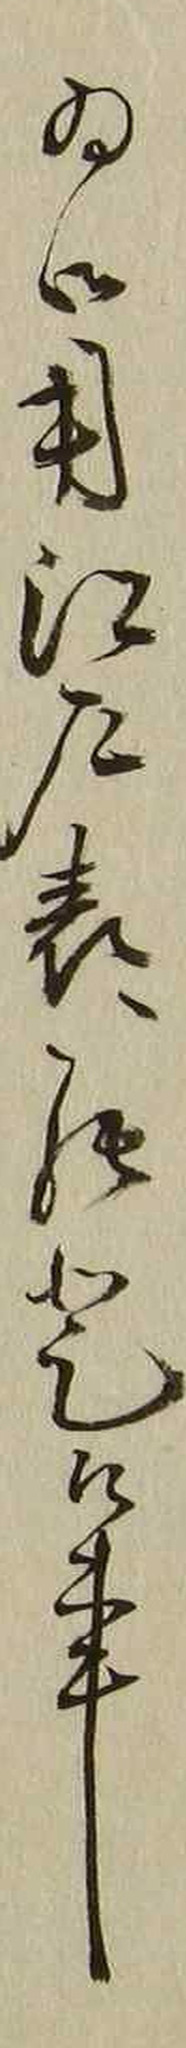為御用江戸表へ罷登候事
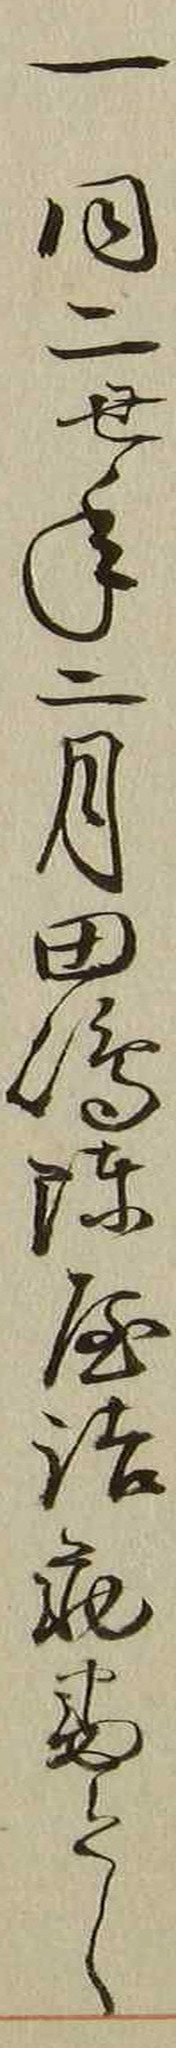一同二丑年二月田島陣屋詰勤番とし
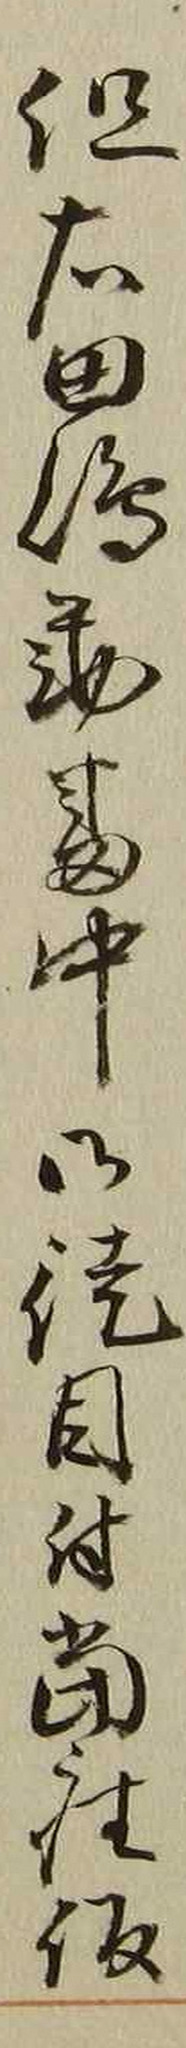但右田島勤番中御徒目付当座仮
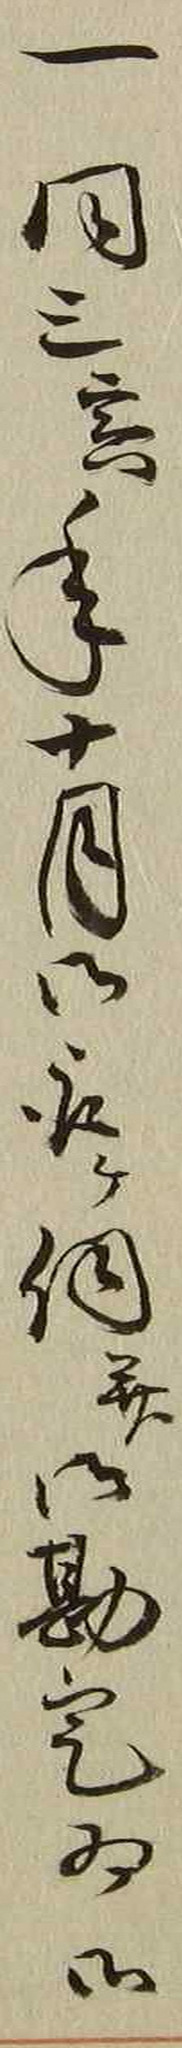一同三寅年十月御取ヶ伺并御勘定為御
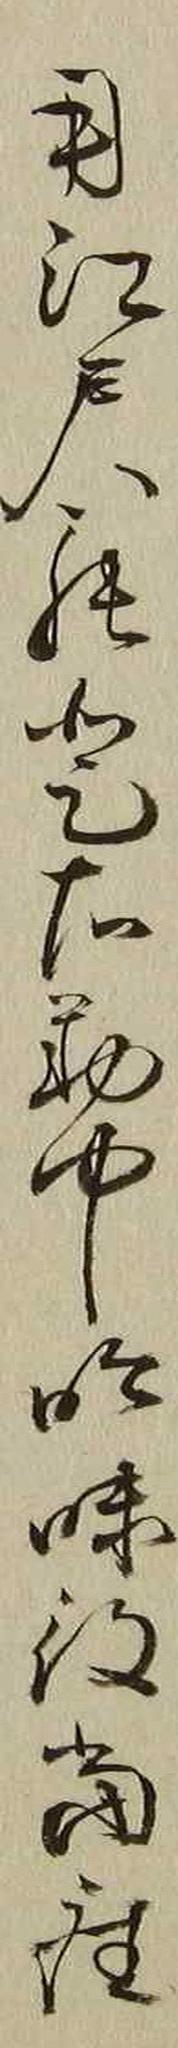用江戸へ罷登右勤中吟味役当座
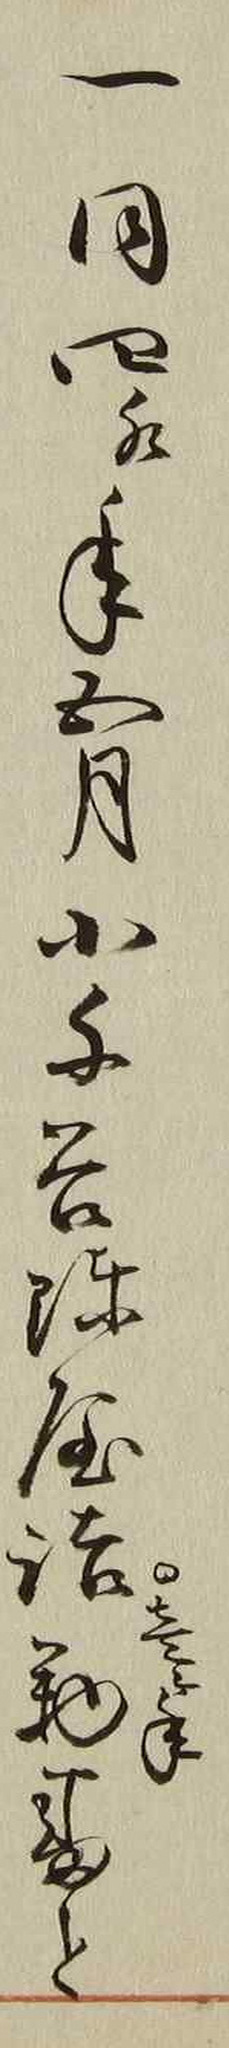一同四卯年五月小千谷陣屋詰勤番と
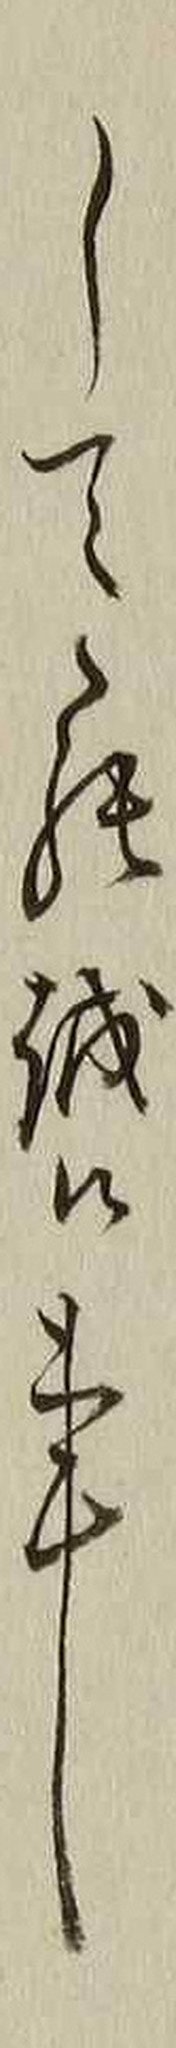して罷越候事
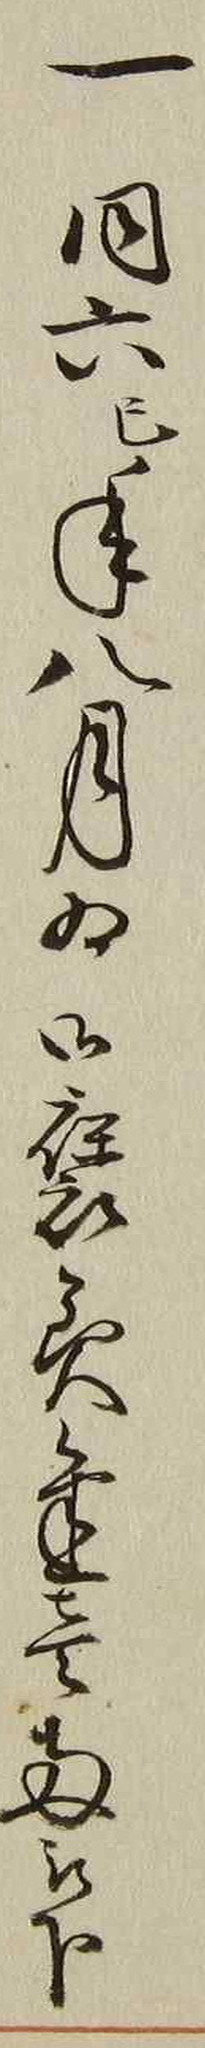一同六巳年八月為御褒美金壱両被下
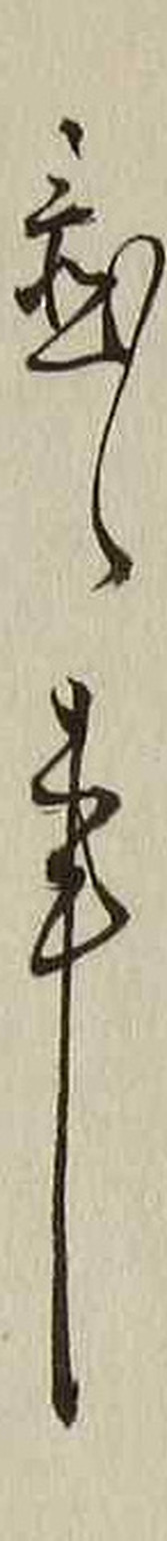置候事
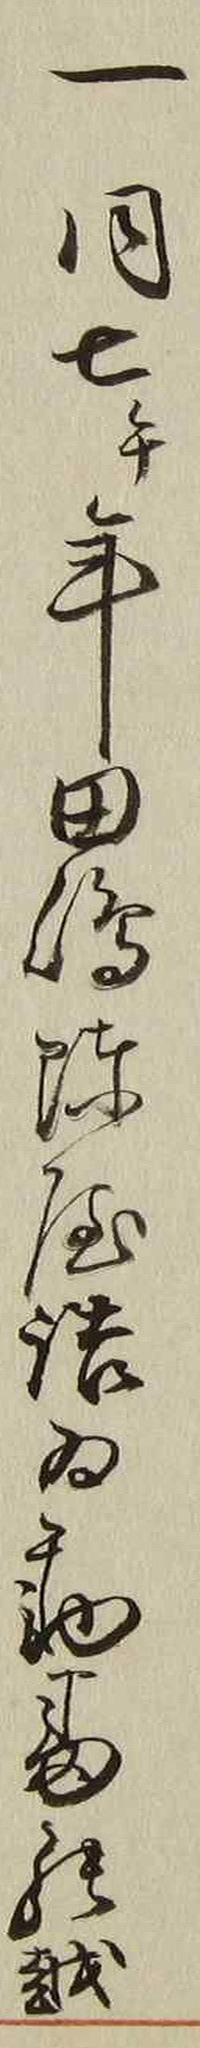一同七午年田島陣屋詰為勤番罷越
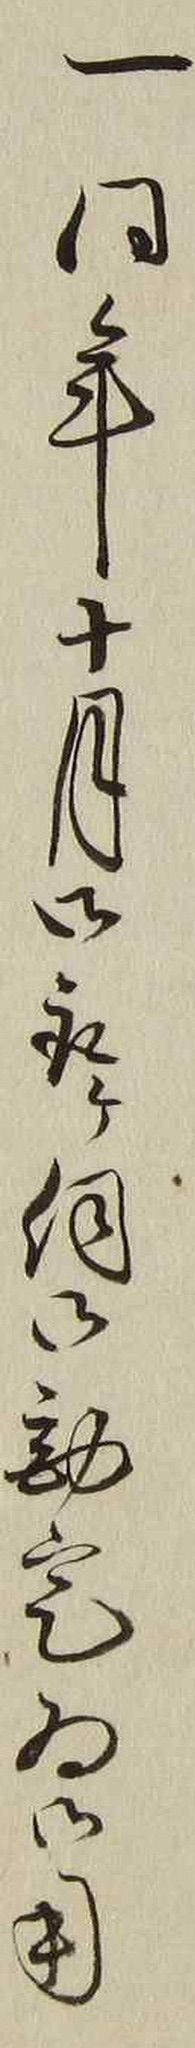一同年十月御取ヶ伺御勘定為御用
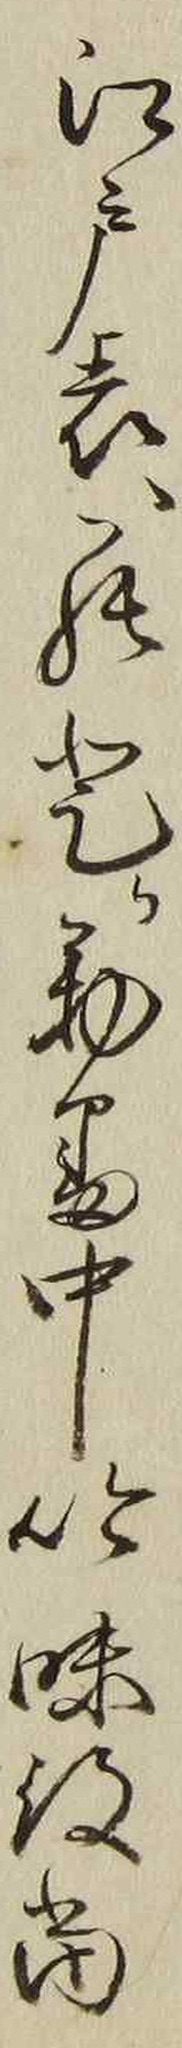江戸表へ罷登り勤番中吟味役当
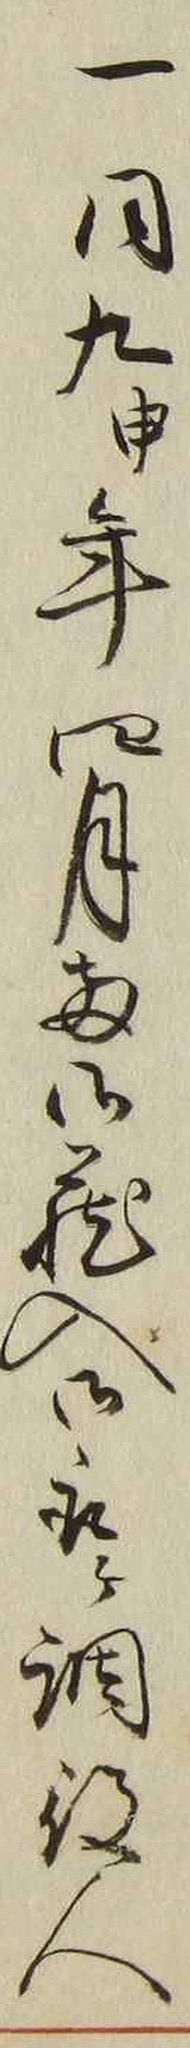一同九申年四月両御蔵入御取ヶ調役人

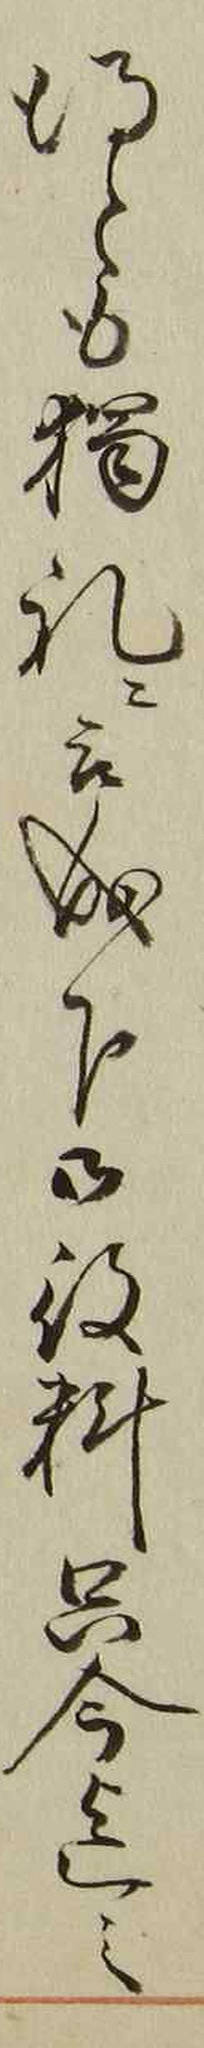得とも独礼ニ被成下御役料只今迄之
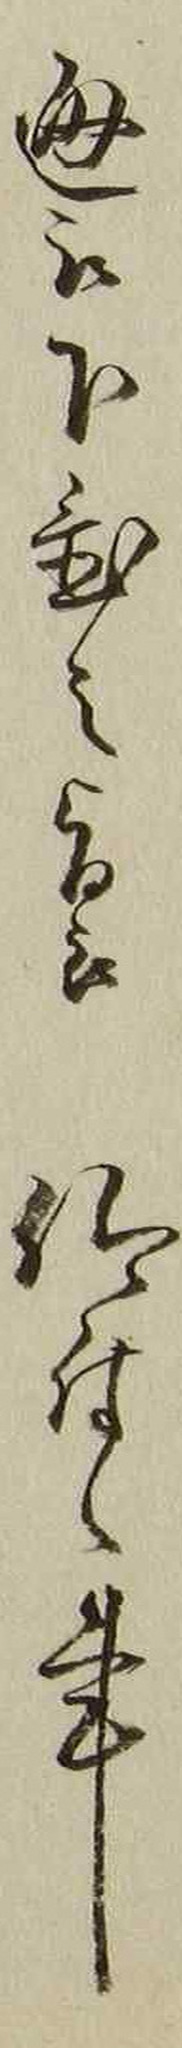通被下置之旨被仰付候事
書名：諸士系譜　巻之57　ほ之部4
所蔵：会津若松市立会津図書館
